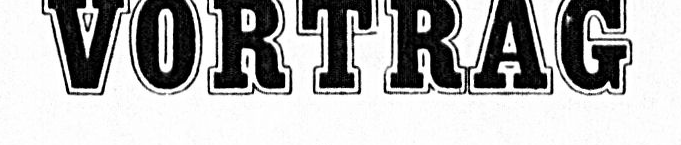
VORTRAG
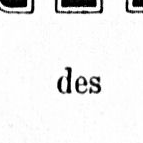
des
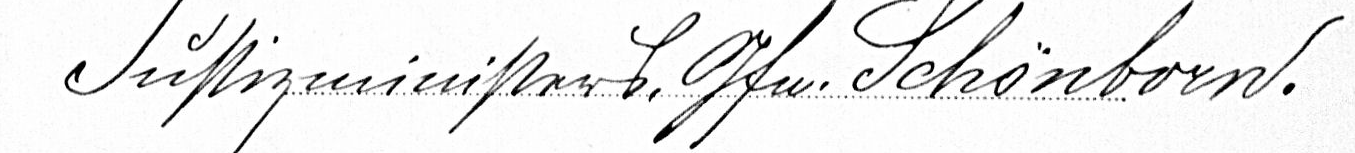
Justizminister. Gfn. Schönborn.
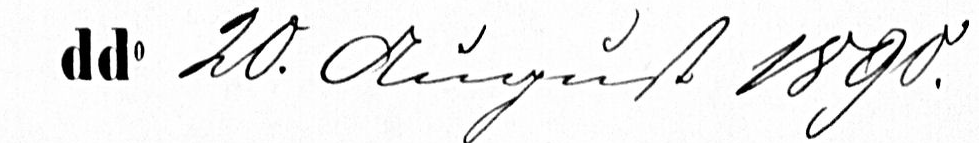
dd° 20. August 1890.
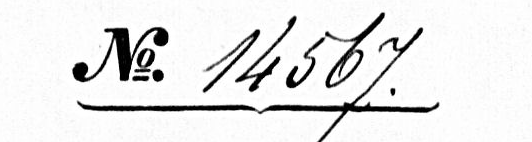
N° 14567.
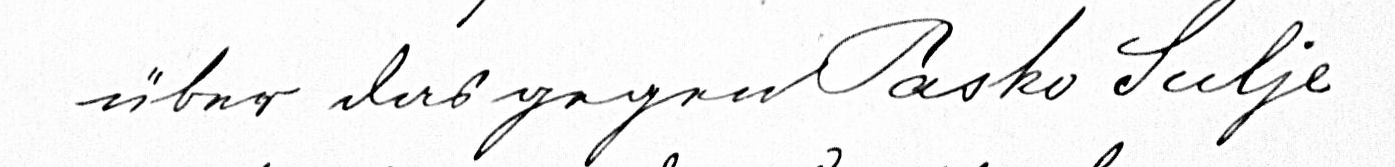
über das gegen Pasko Sulje
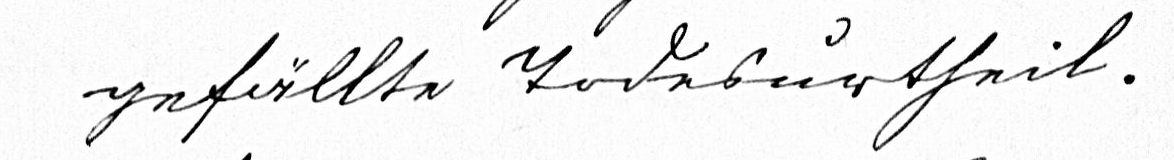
gefällte Todesurtheil.
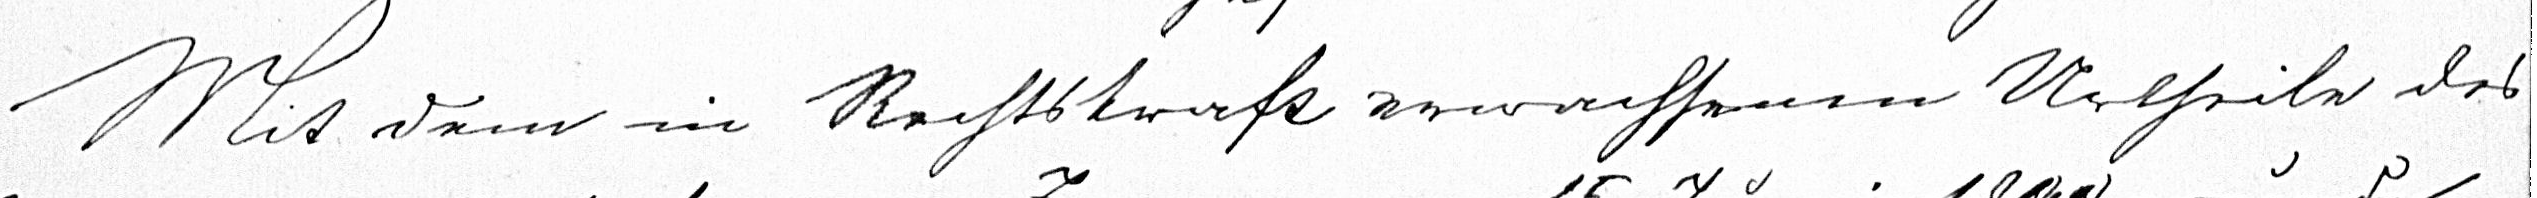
Mit dem in Rechtskraft verwachsenen Urtheile des
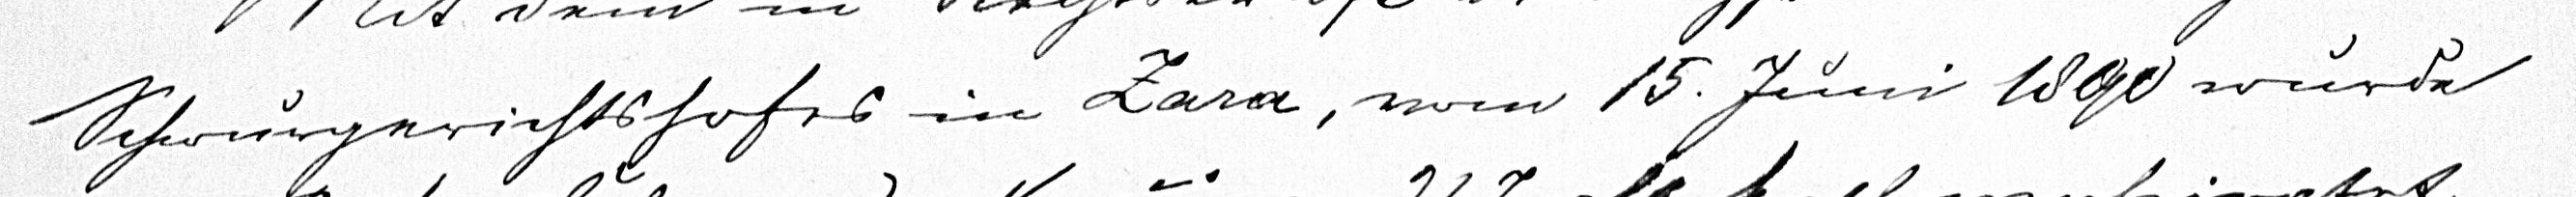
Schwurgerichtshofes in Zara, vom 15. Juni 1890 wurde
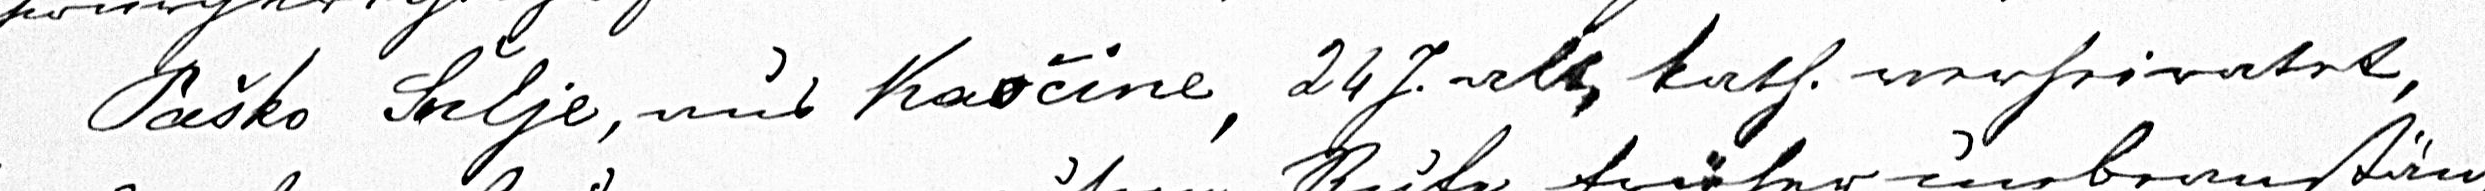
Paško Sulje, aus Kaxxčine, 24 J. alt, kth. verheiratet,
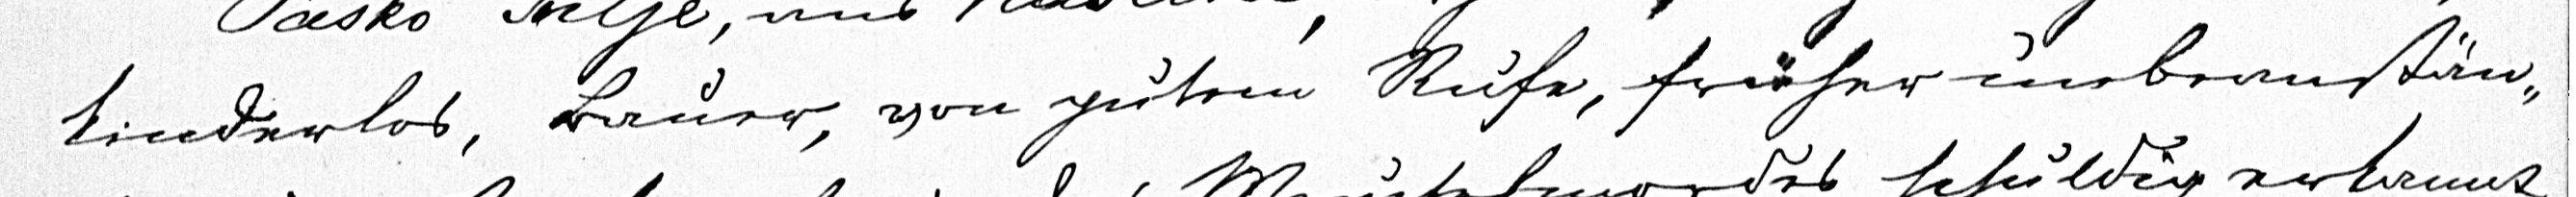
kinderlos, Bauer, von guten Rufe, früher unbranstän¬
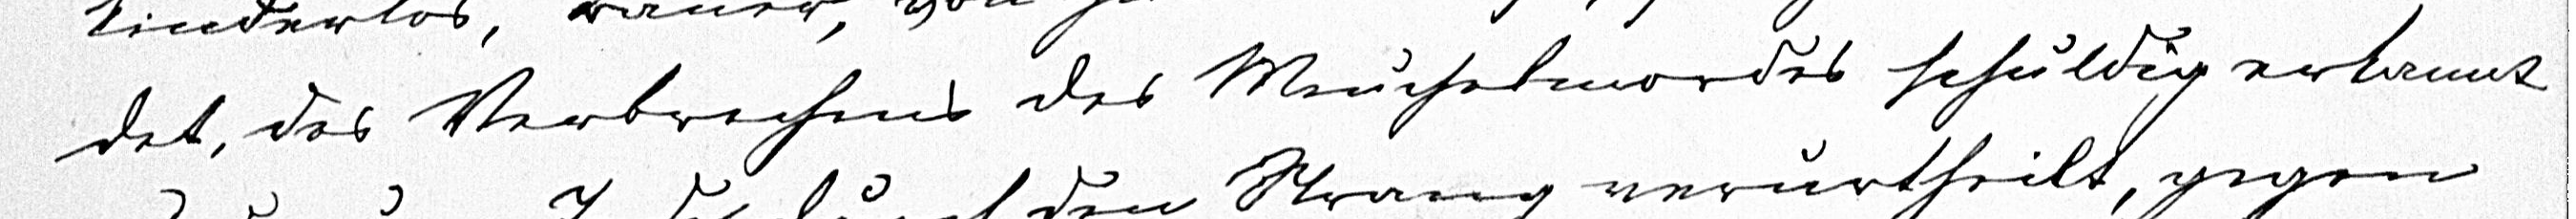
det, des Verbrechens des Meuchelmordes schuldig erkannt
